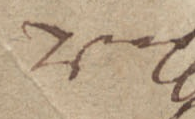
sich
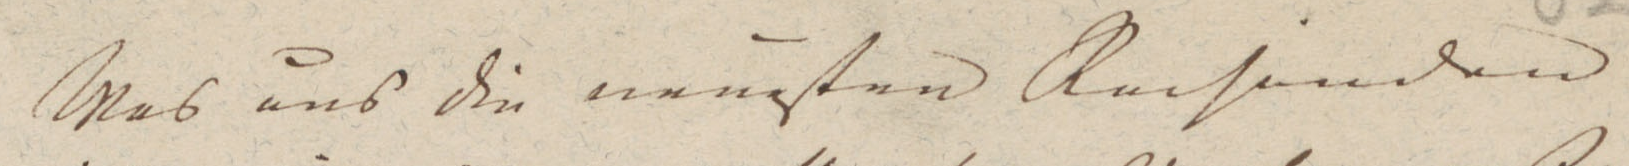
Was uns die neuesten Reisenden
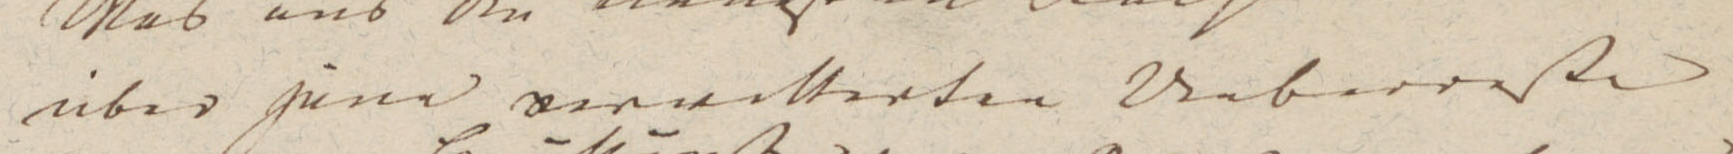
über jene verwitterten Ueberreste
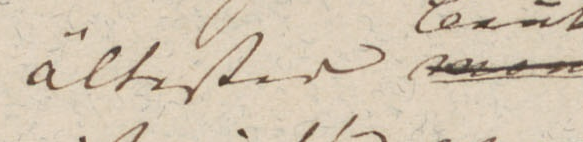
ältester monumentaler
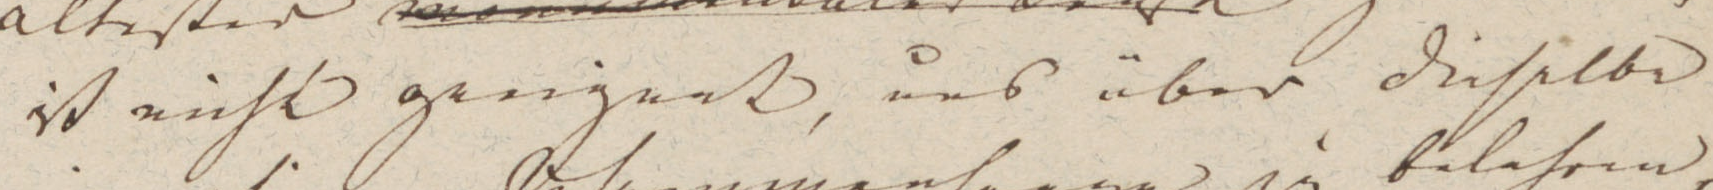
ist nicht geeignet, uns über dieselbe
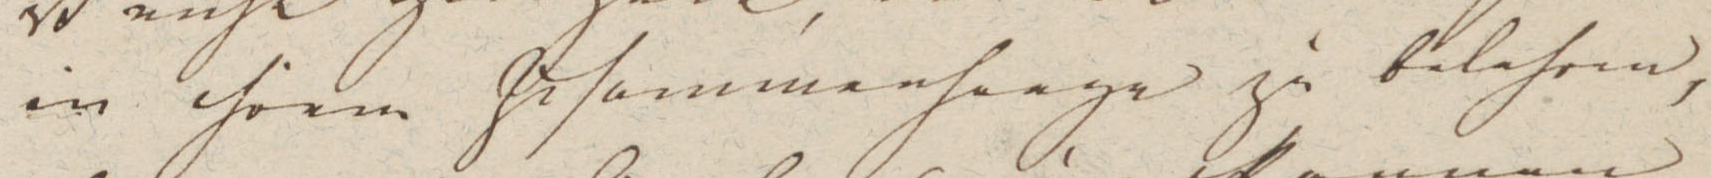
in ihrem Zusammenhange zu belehren,
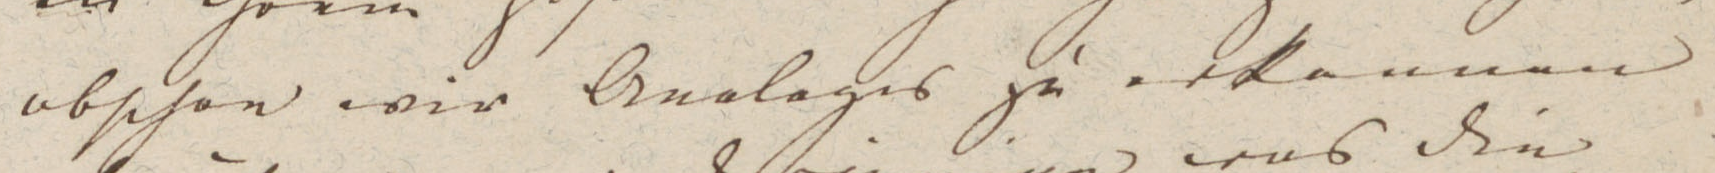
obschon wir Analoges zu erkennen
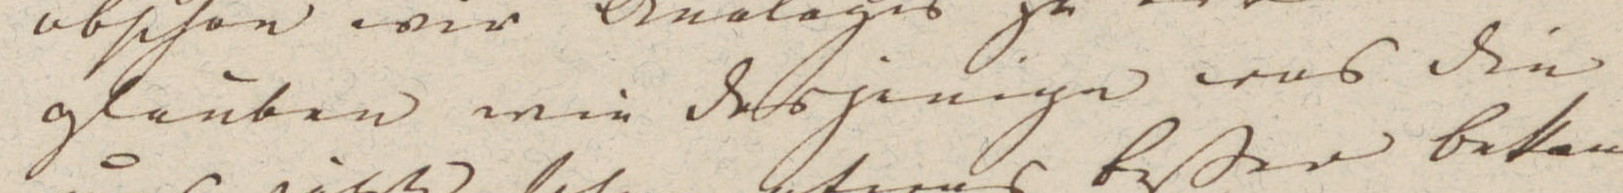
glauben wie dasjenige was die
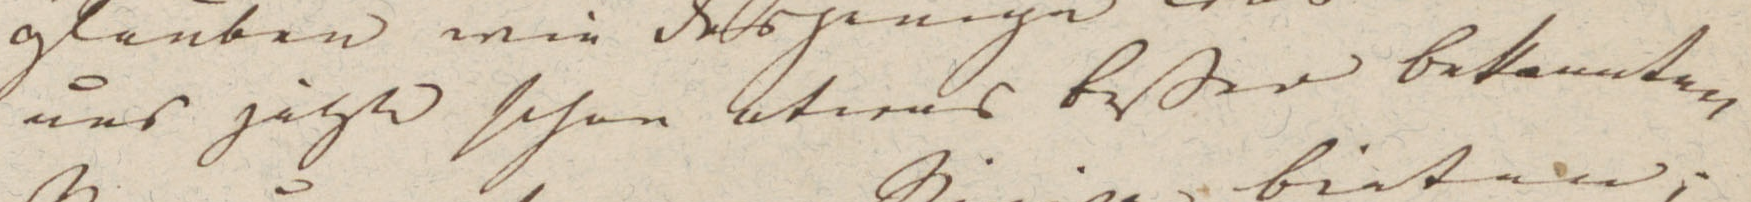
uns jetzt schon etwas besser bekannten
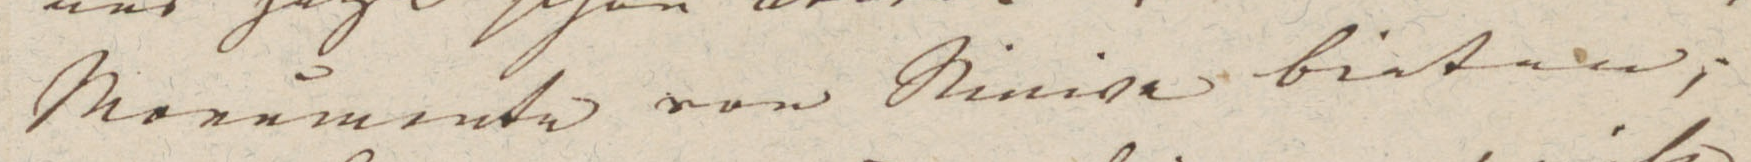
Monumente von Ninive bieten;
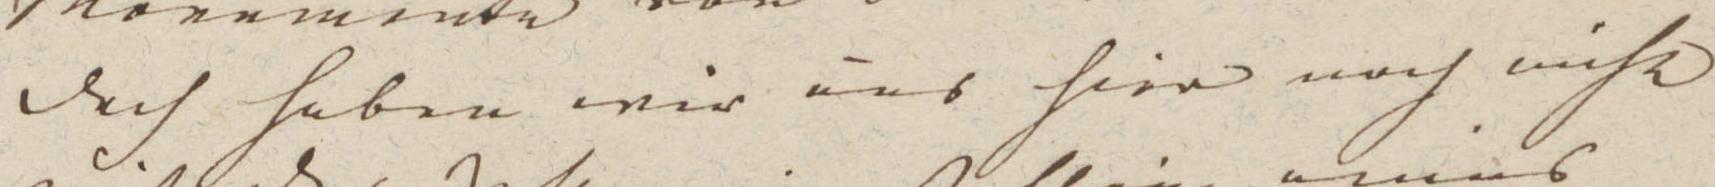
Doch haben wir uns hier noch nicht
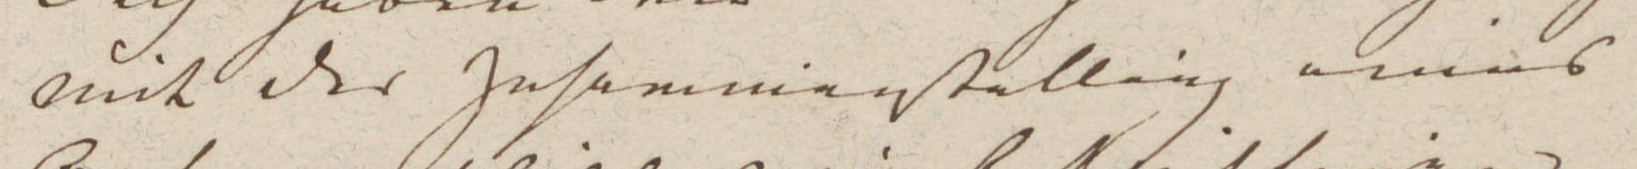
mit der Zusammenstellung eines
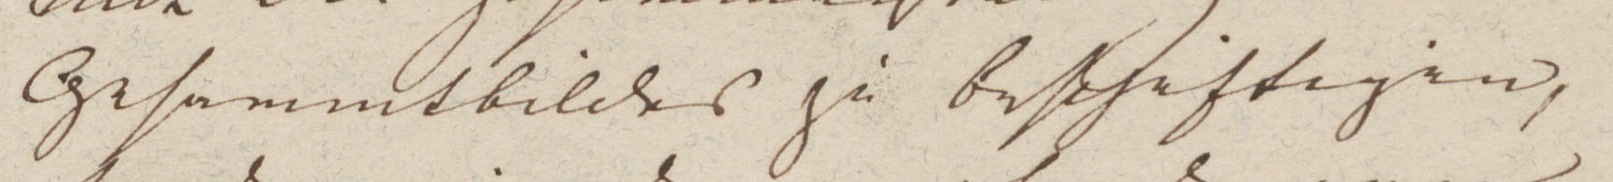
Gesammtbildes zu beschäftigen,
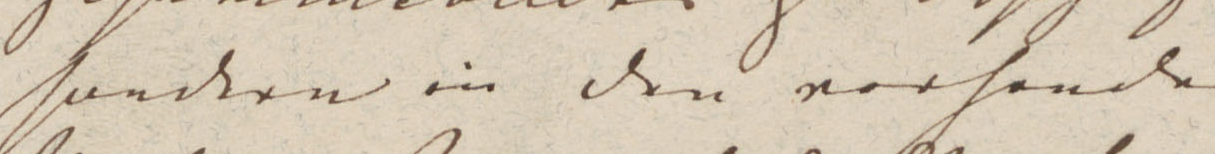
sondern in den vorhandenen
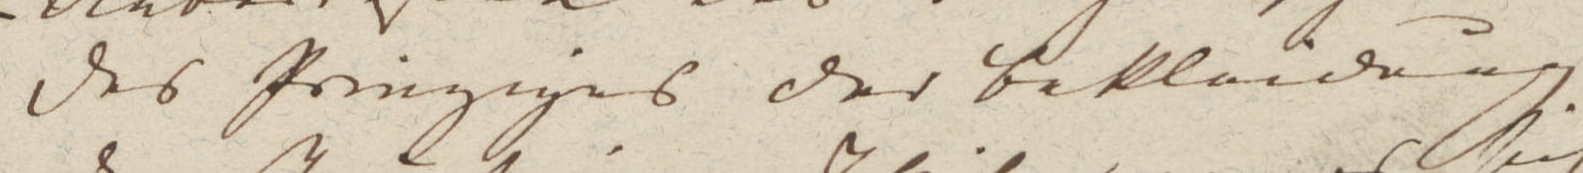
des Prinzipes der Bekleidung
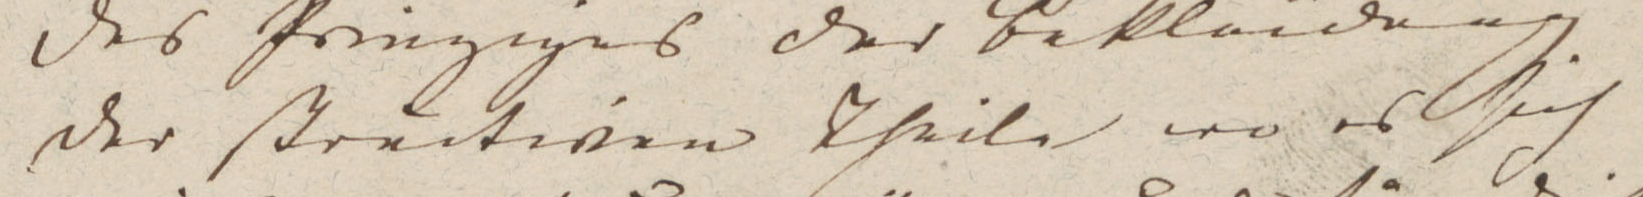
der structiven Theile wo es sich
